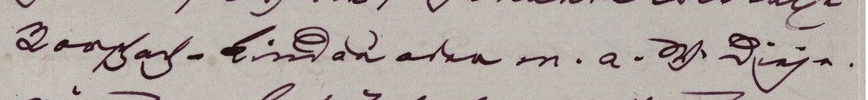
Rorschach–Lindau oder m. a. W. dieje-
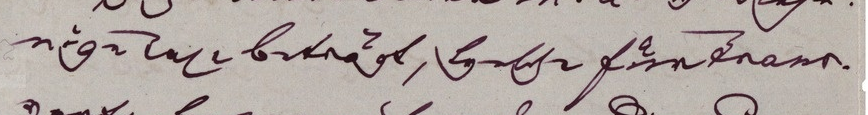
nige Taxe beträgt, welche für Trans-
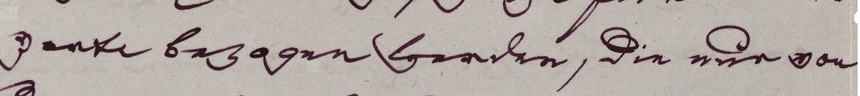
porte bezogen werden, die nur von
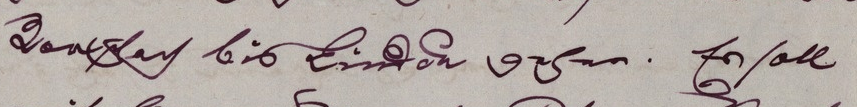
Rorschach bis Lindau gehen. Es soll
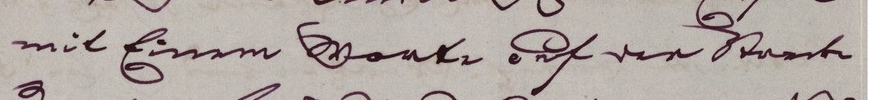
mit Einem Worte auf der Strecke
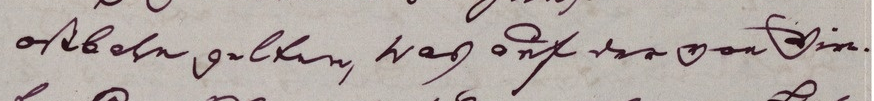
ostbahn gelten, was auf der von Win-
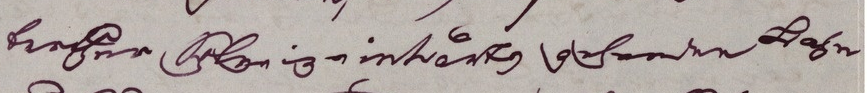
terthur Schweizeinwärts gehenden Bahn
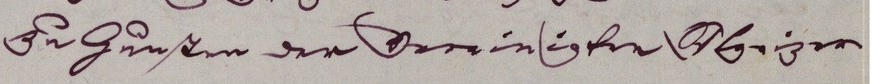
zu Gunsten der Vereinigten Schweizer-
